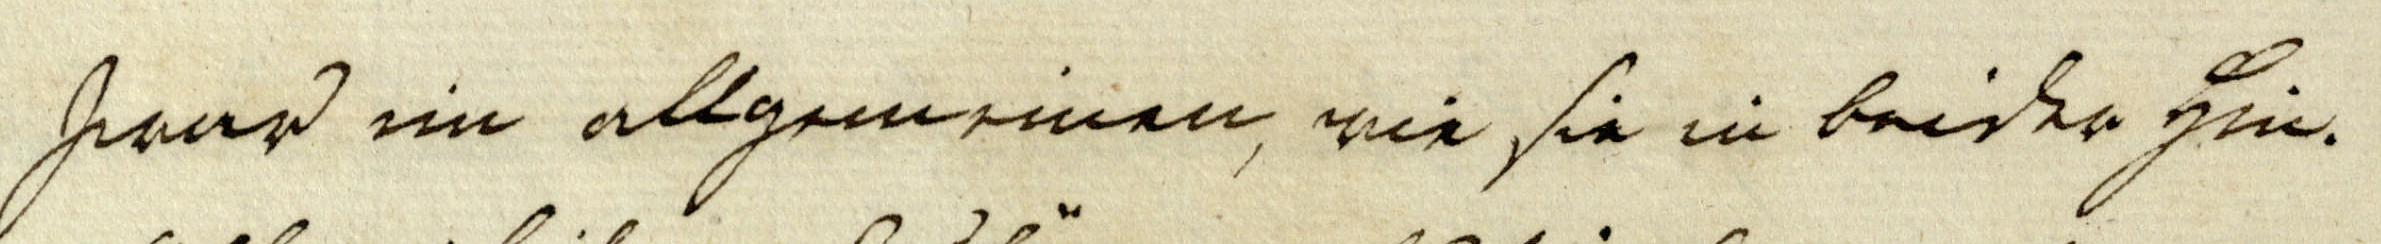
zwar im allgemeinen, wie sie in beider Hin¬
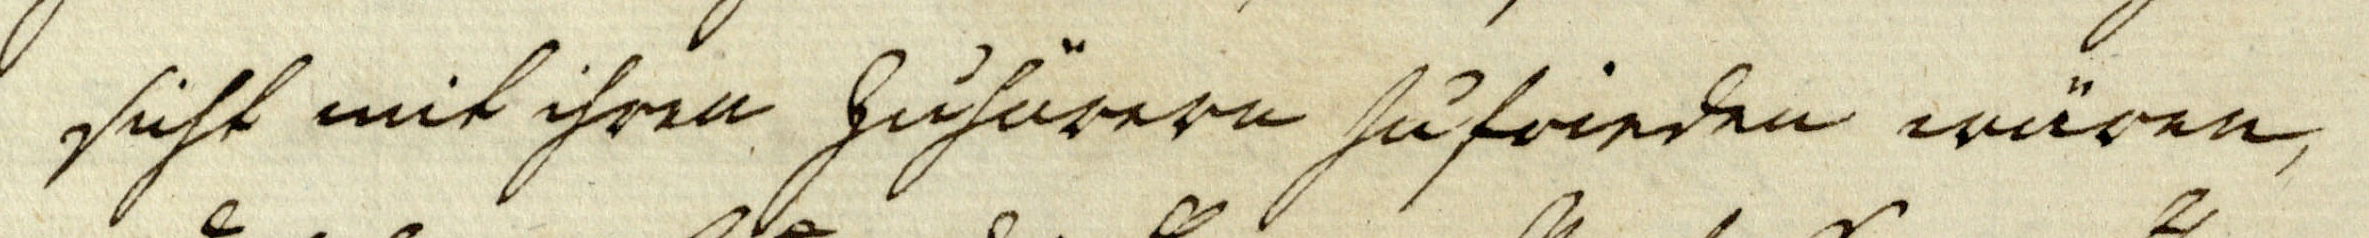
sicht mit ihren Zuhörern zufrieden wären,
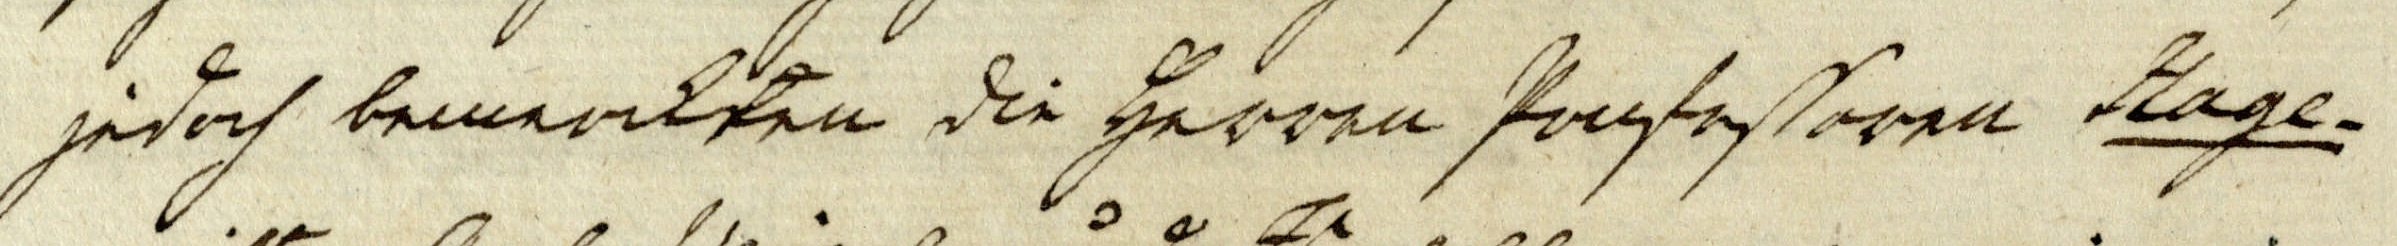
jedoch bemerckten die Herren Professoren Hage¬
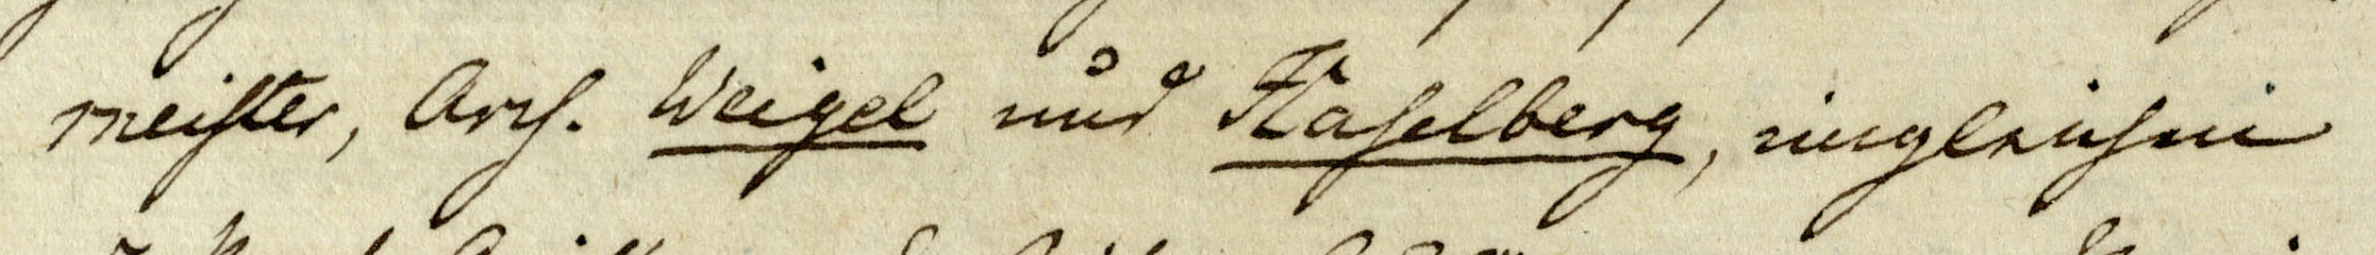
meister, Arch. Weigel und Haselberg, imgleichen
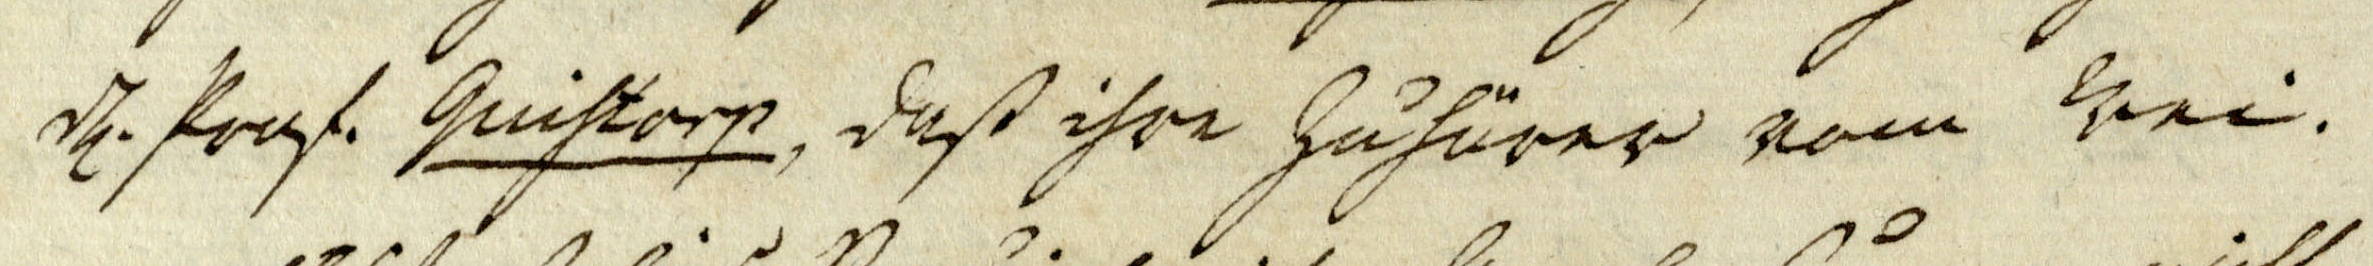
dh. Prof. Quistorp, daß ihre Zuhörer vom Wei¬
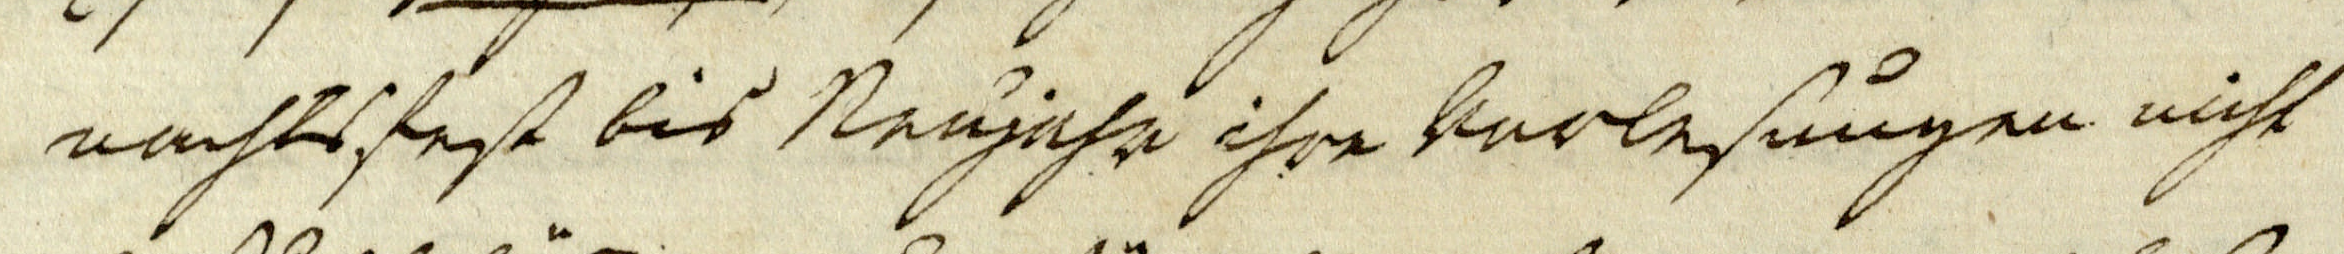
nachtsfest bis Neujahr ihre Vorlesungen nicht
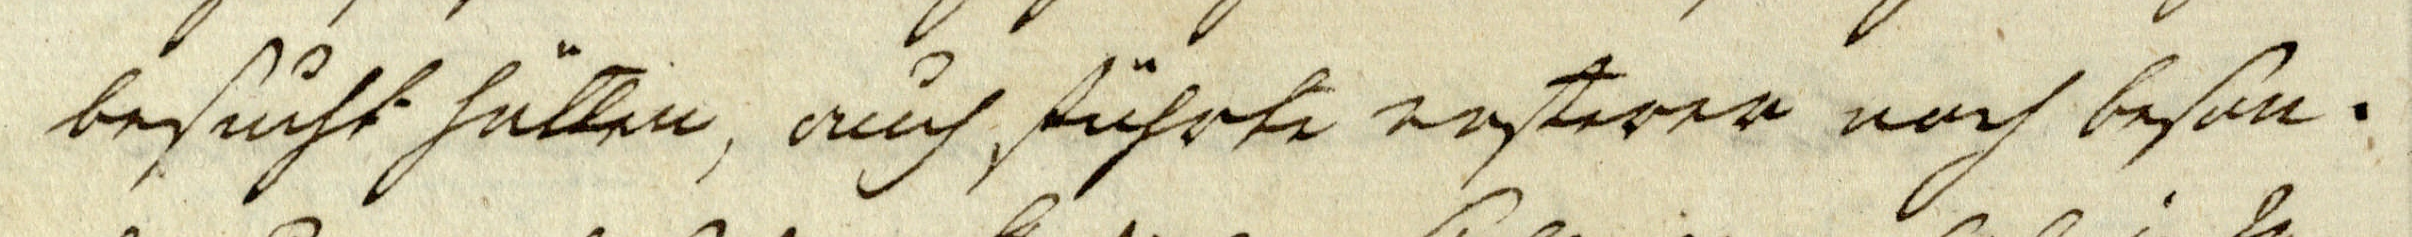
besucht hätten, auch führte ersterer noch beson¬
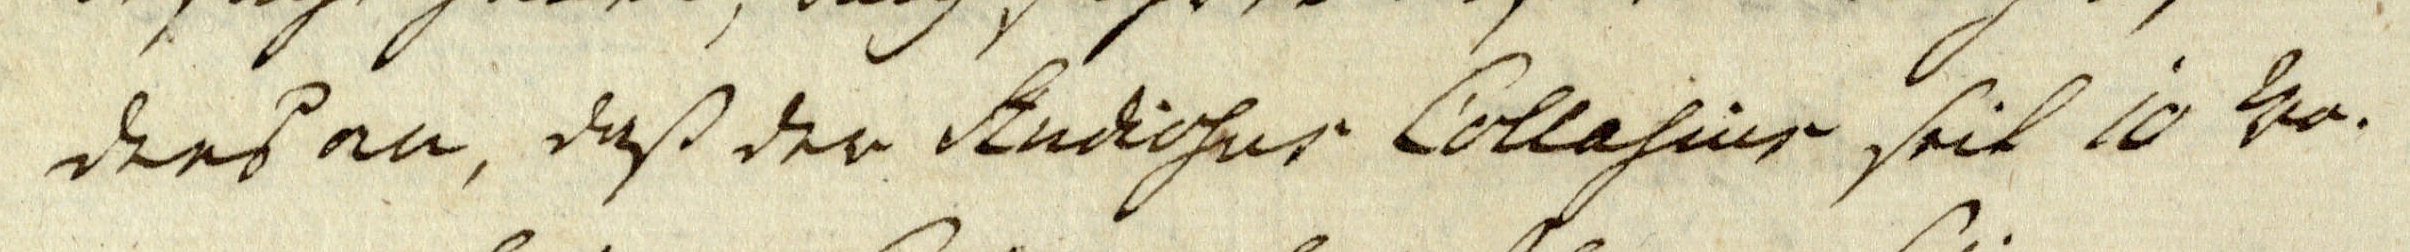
ders an, daß der Studiosus Collasius seit 10 Wo¬
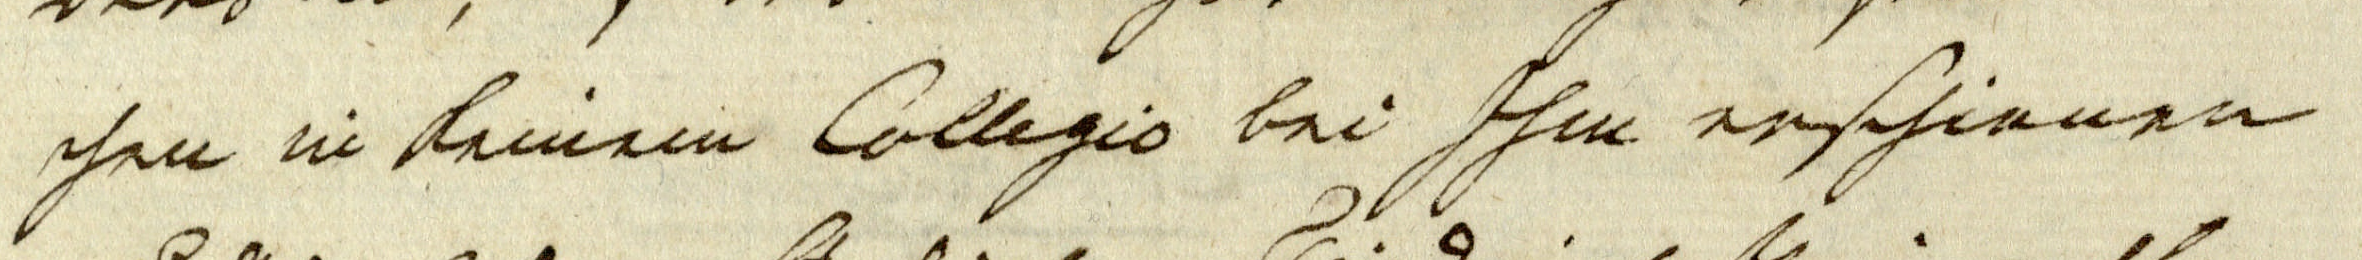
chen in keinem Collegio bei Ihm erschienen
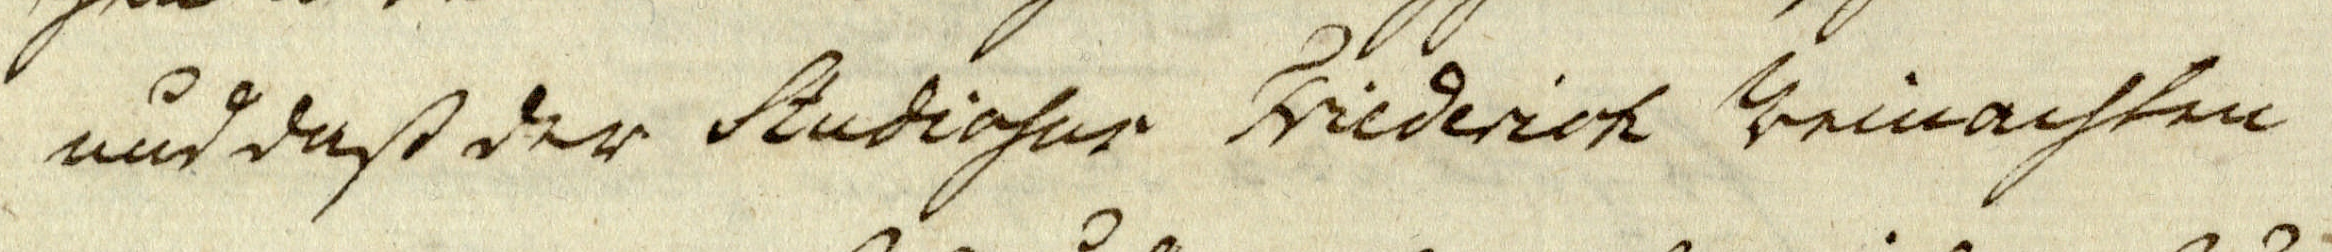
und daß der Studiosus Friederich Weinachten
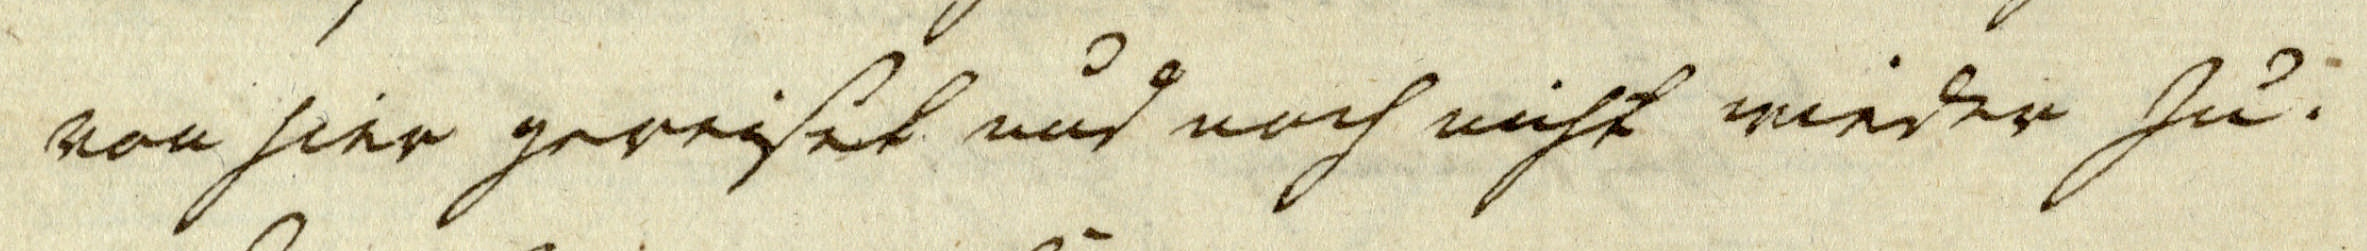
von hier gereiset und noch nicht wieder zu¬
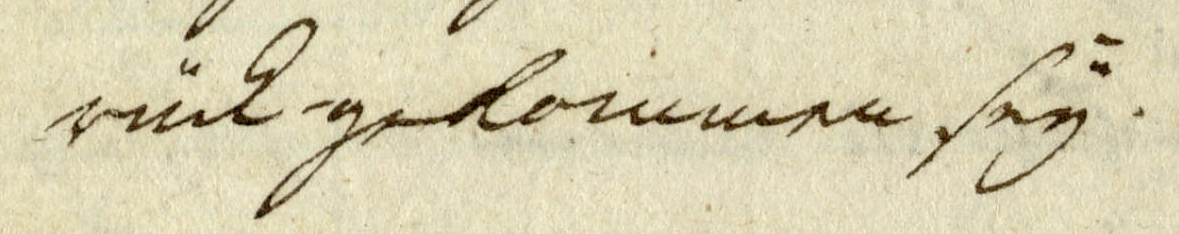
rüick gekommen seÿ.
